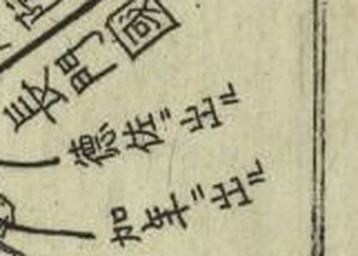徳佐に出る
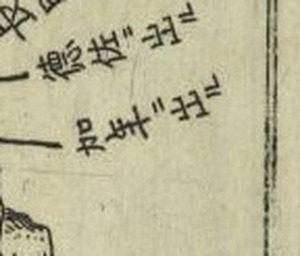加年に出る
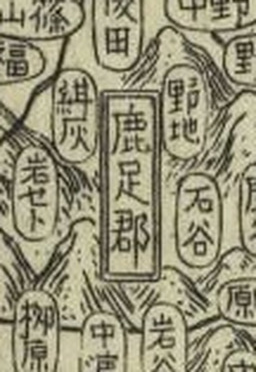鹿足郡
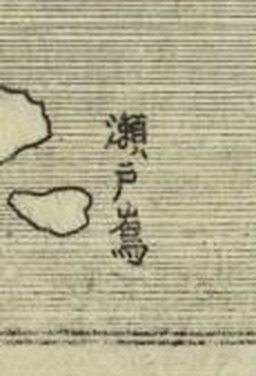瀬戸嶌
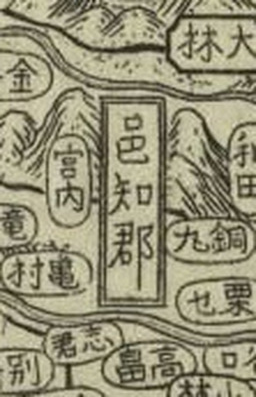邑地郡
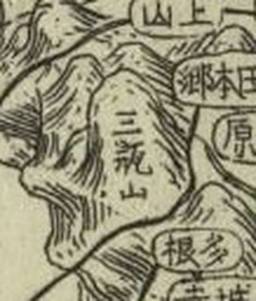三瓶山
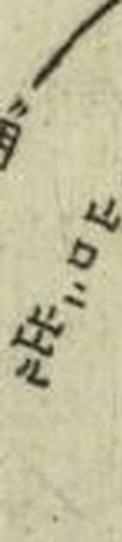山口に出る

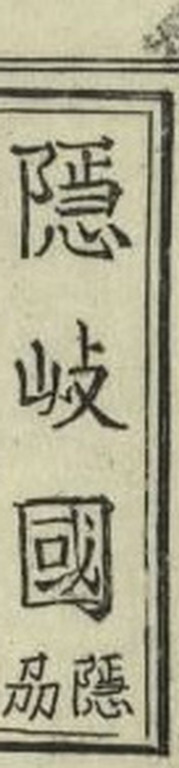隠岐郡
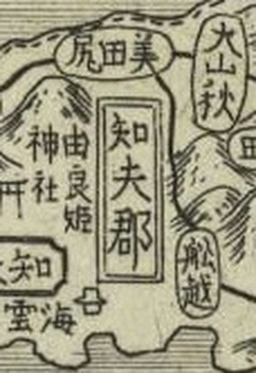知夫郡
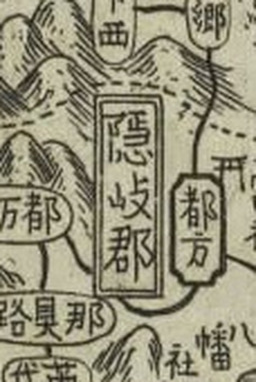隠岐郡
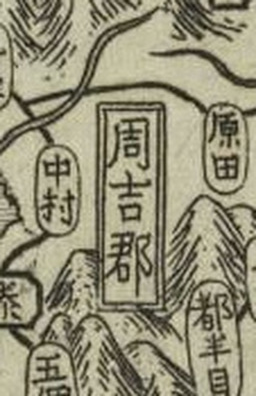周吉郡

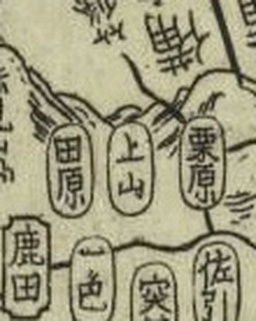四十出
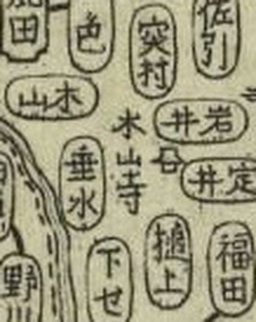木山寺
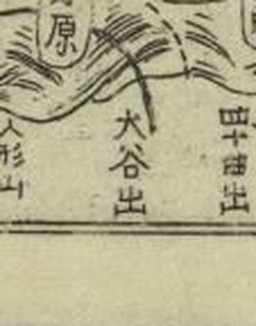大谷出
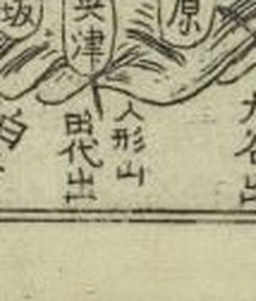人形山
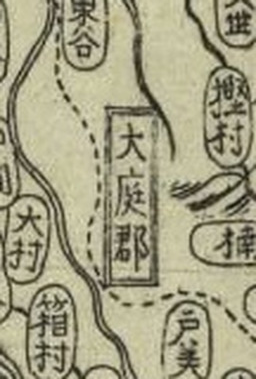大庭郡
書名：大日本国細図 西国之部 下
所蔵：University of the Ryukyus Library
